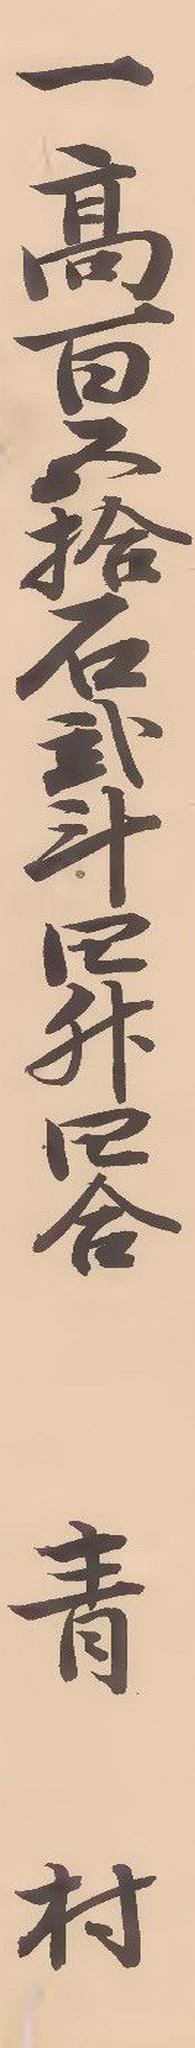一高百五拾石弐斗四升四合青村

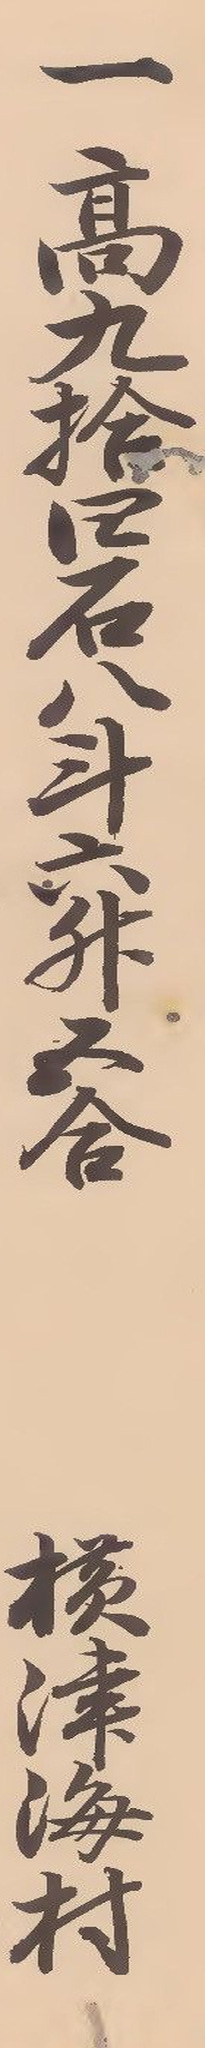一高九拾四石八斗六升五合横津海村
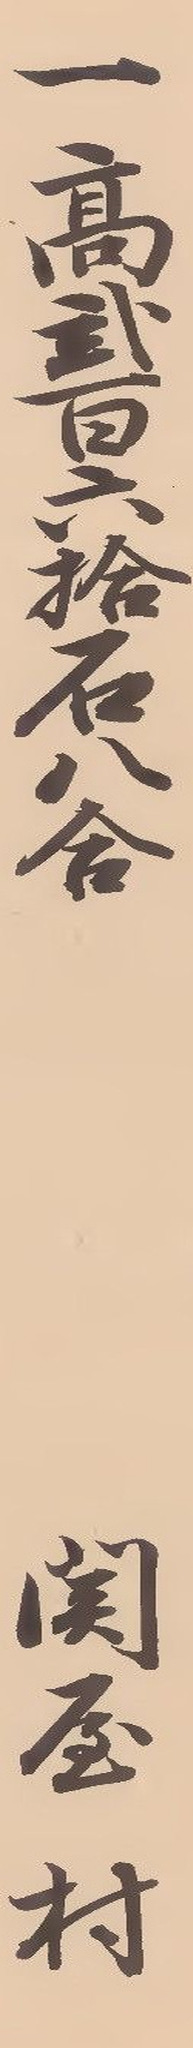一高弐百六拾石八合関屋村
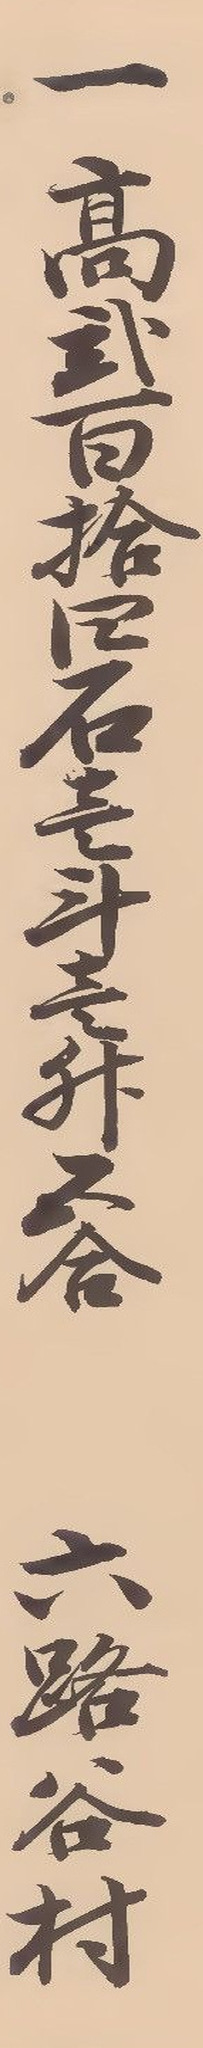一高弐百拾四石壱斗壱升五合六路谷村
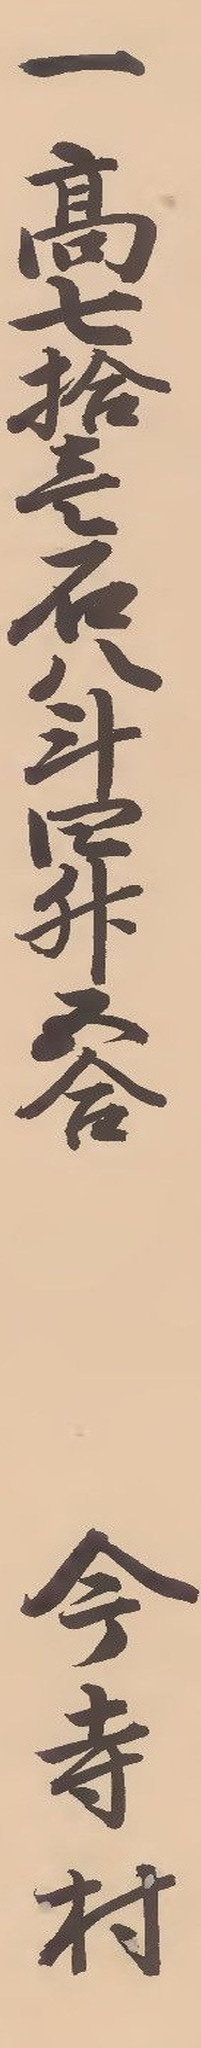一高七拾壱石八斗四升五合今寺村
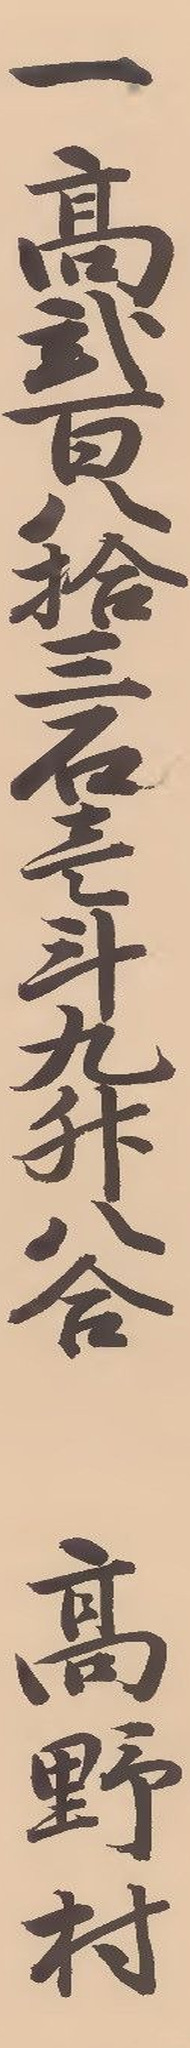一高弐百八拾三石壱斗九升八合高野村
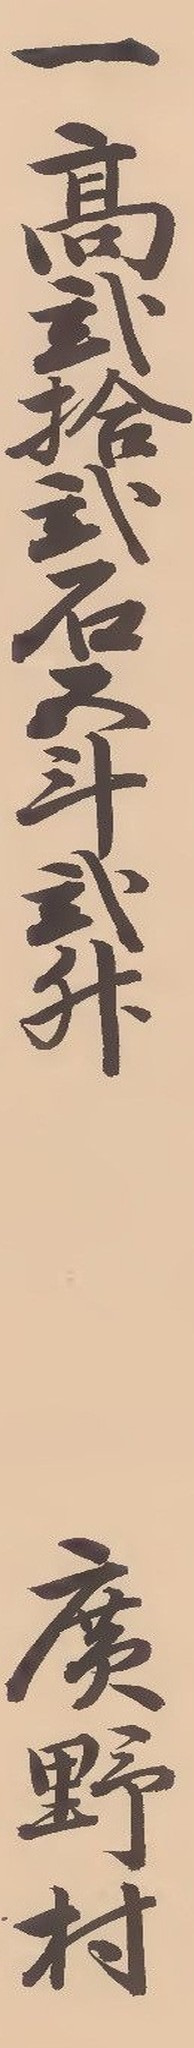一高弐拾弐石五斗弐升広野村
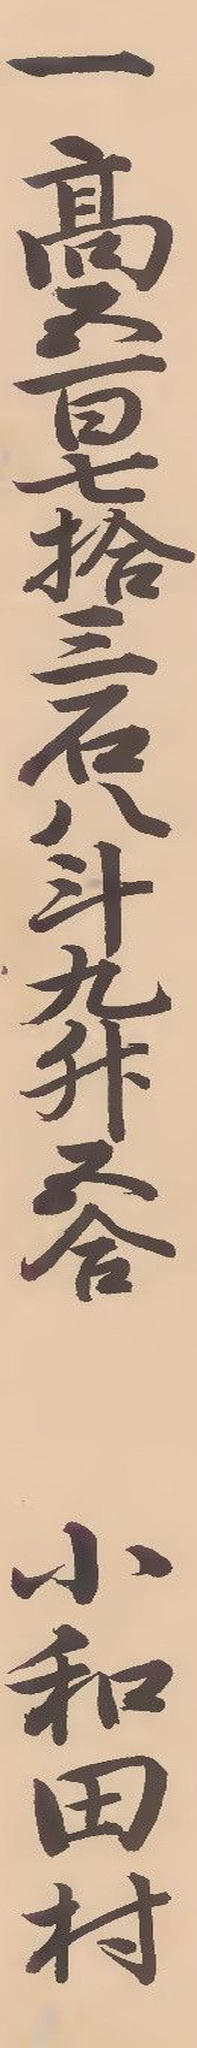一高五百七拾三石八斗九升五合小和田村

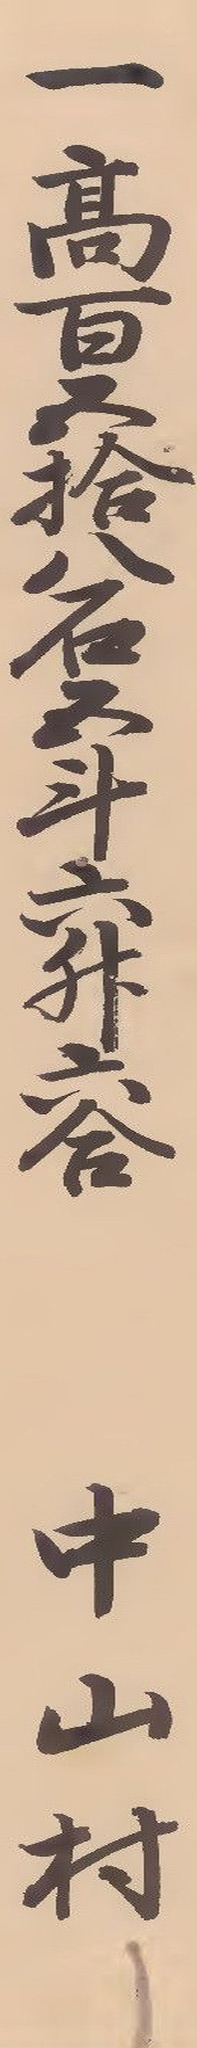一高百五拾八石五斗六升六合中山村
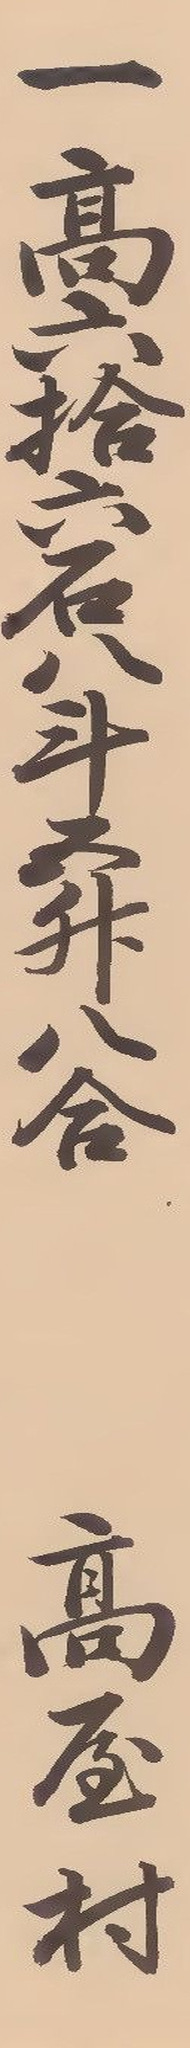一高六拾六石八斗五升八合高屋村
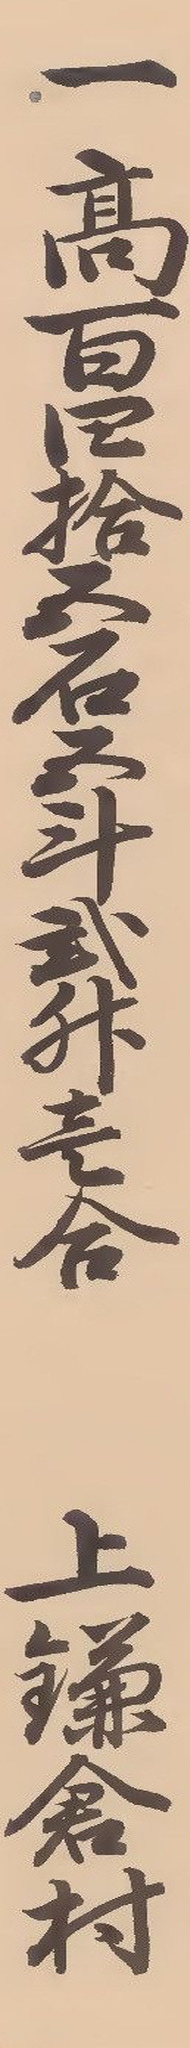一高百四拾五石五斗弐升壱合上鎌倉村
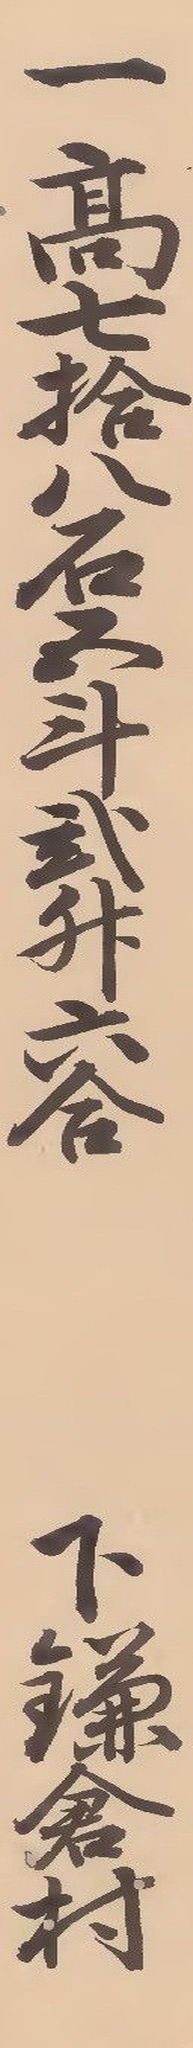一高七拾八石五斗弐升六合下鎌倉村
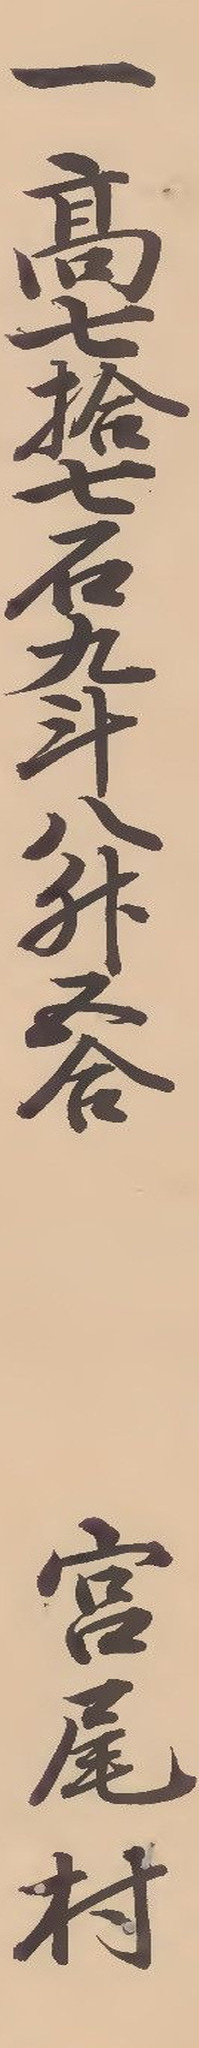一高七拾七石九斗八升五合宮尾村
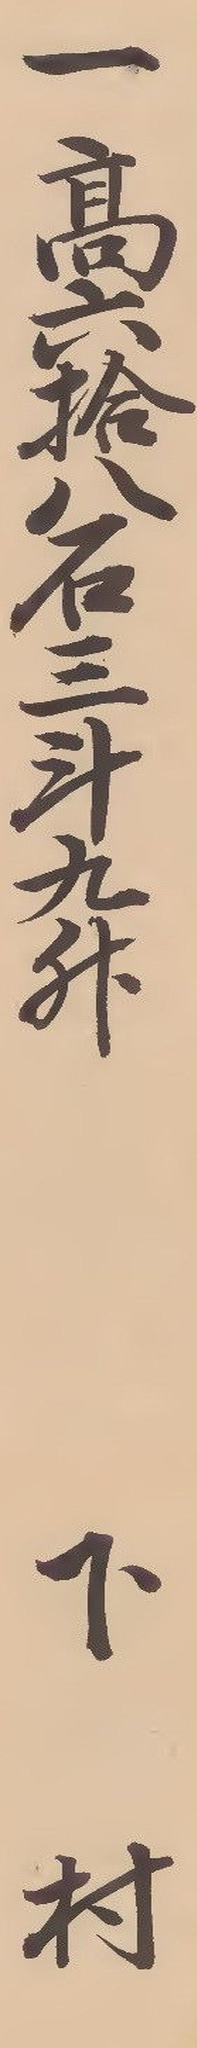一高六拾八石三斗九升下村
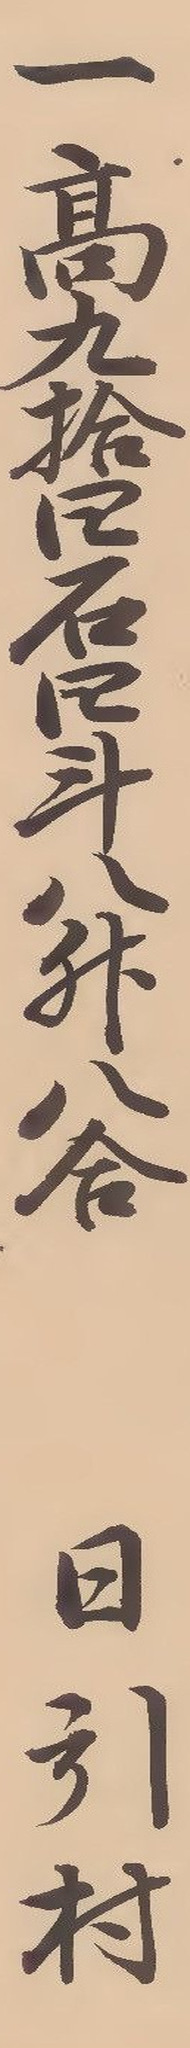一高九拾四石四斗八升八合日引村
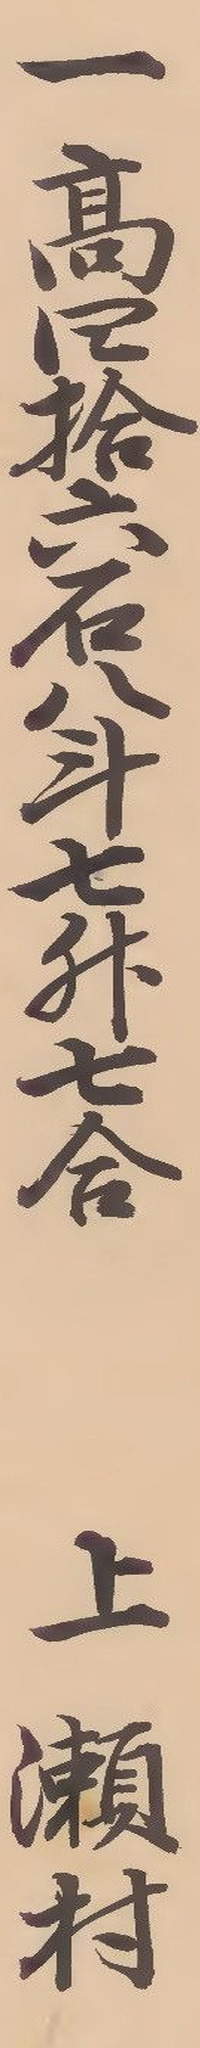一高四拾六石八斗七升七合上瀬村
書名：若狭国郷帳
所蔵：国立公文書館 National Archives of Japan
